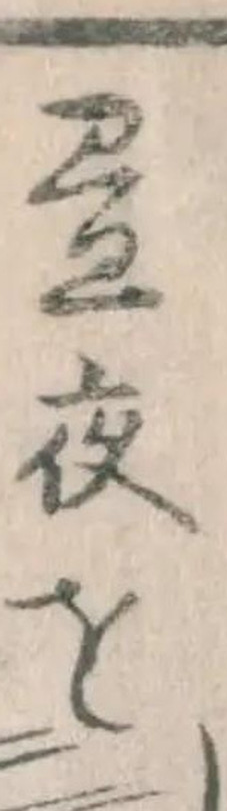昼夜を
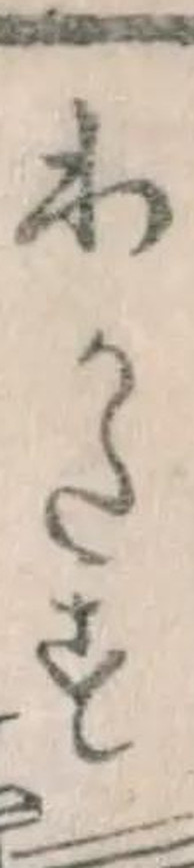わかたす
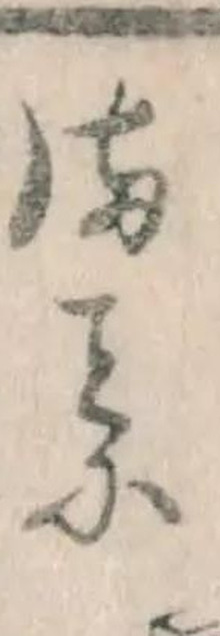まことに

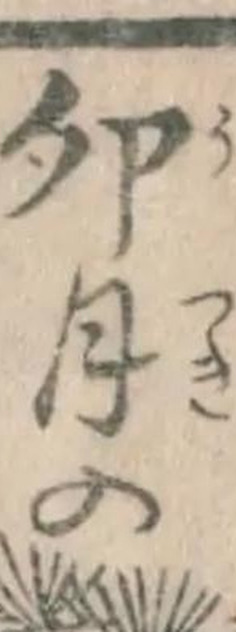卯月の
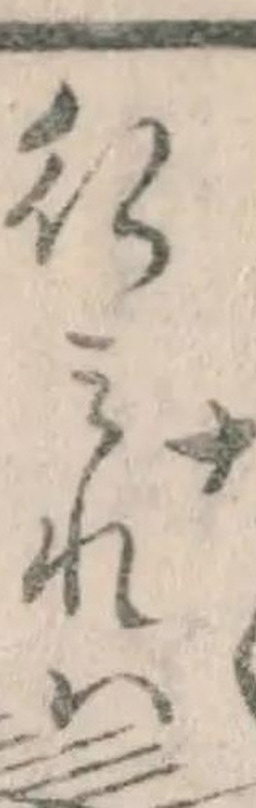行みれは
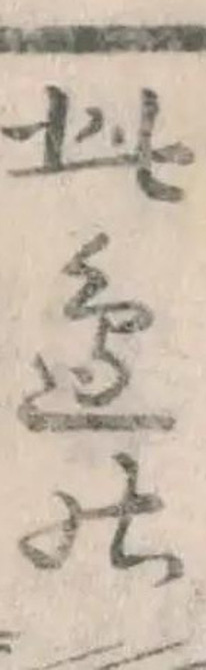此辺の
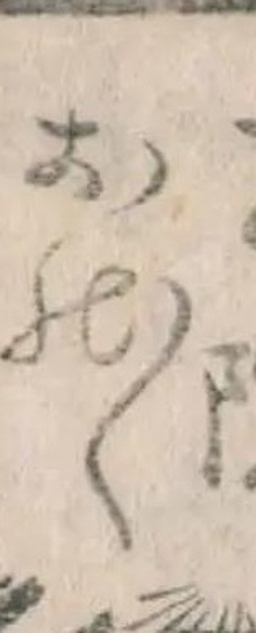おの〳〵
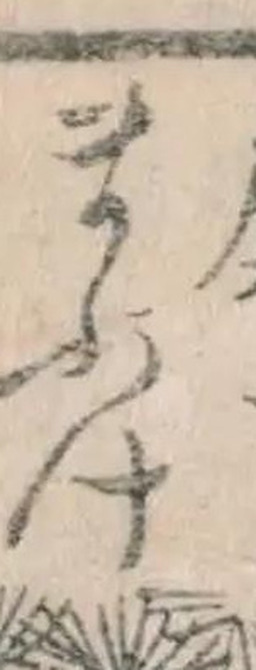まふけ
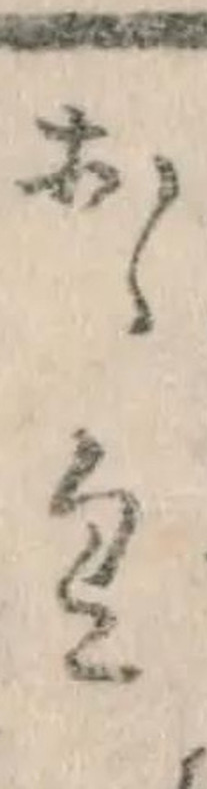おゝく
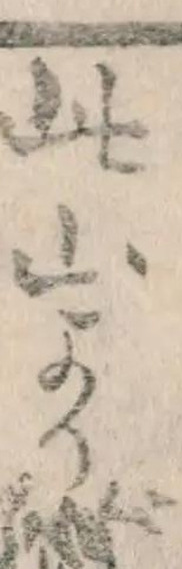此山より
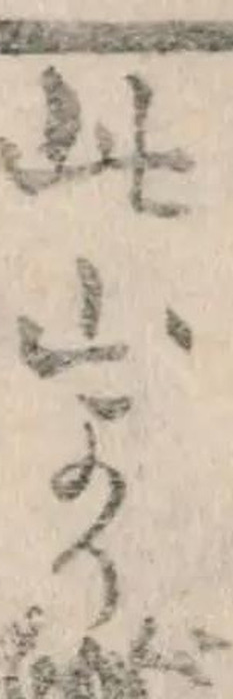此山より
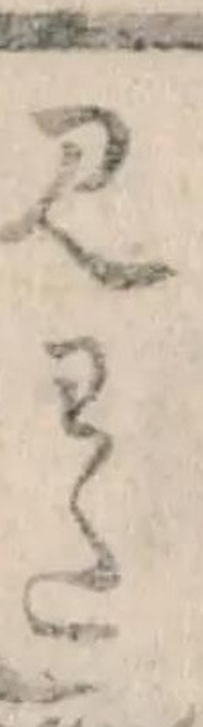見わた
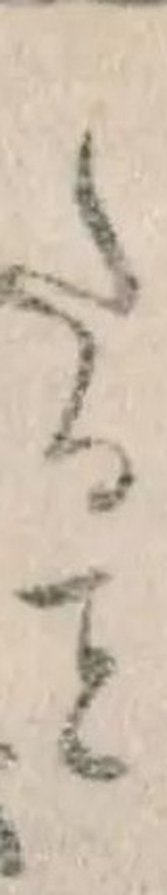たること

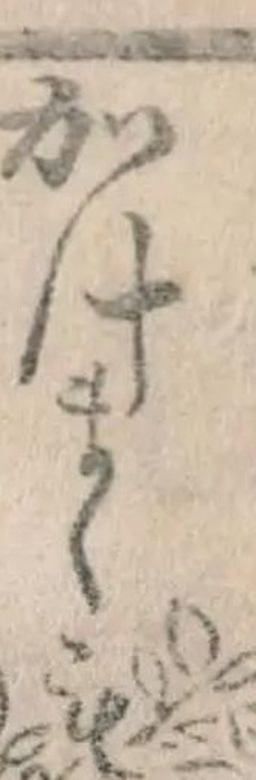かけまくも
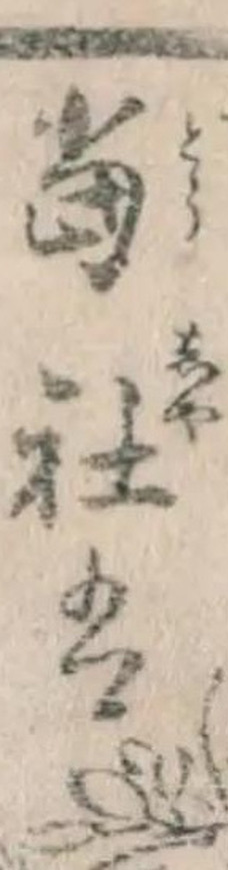当社は
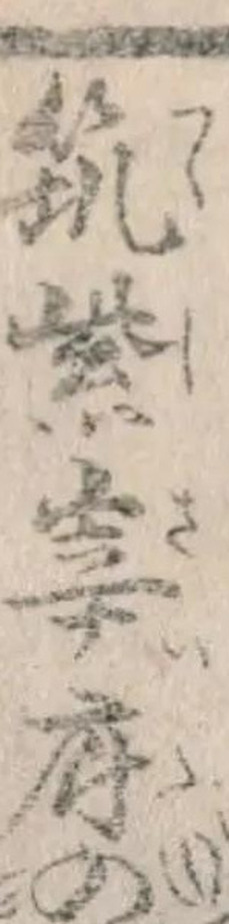筑紫宰府の
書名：絵本物見岡
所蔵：国立国会図書館 National Diet Library, JAPAN
